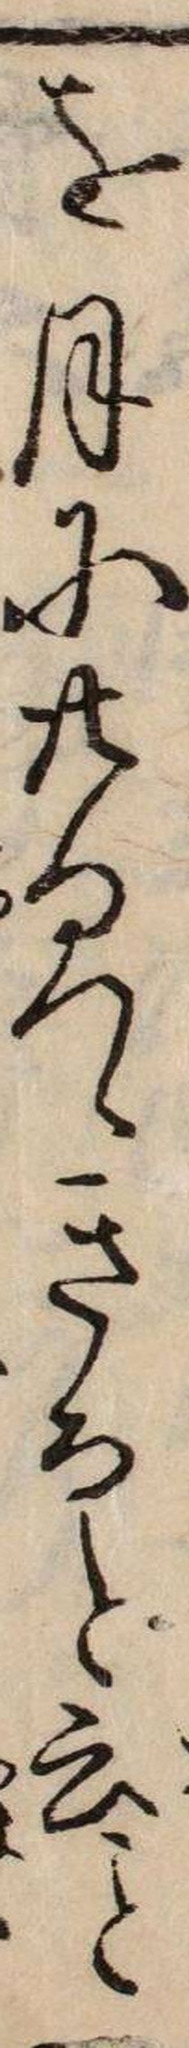を月に廿日つつきると云と
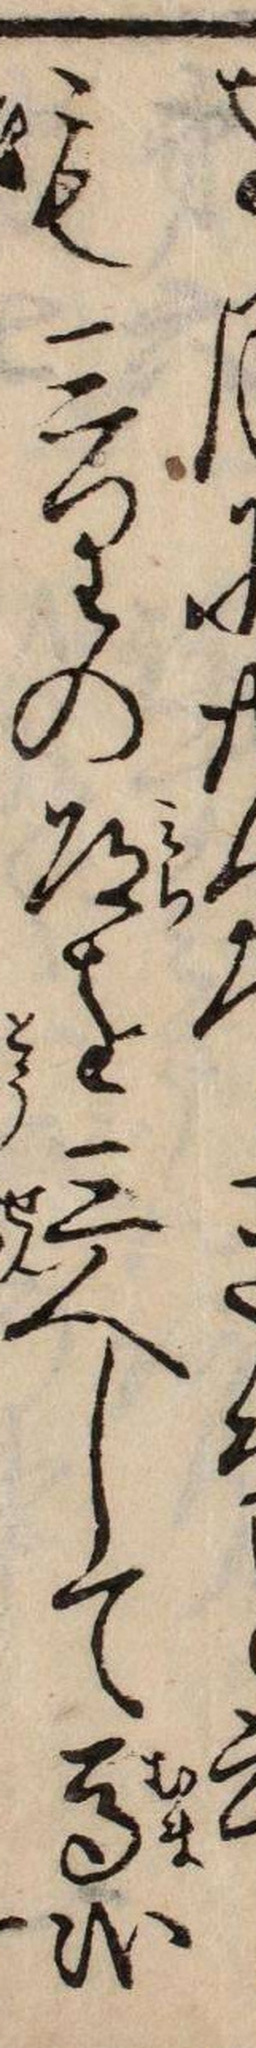も三里の道を三人して馬弐
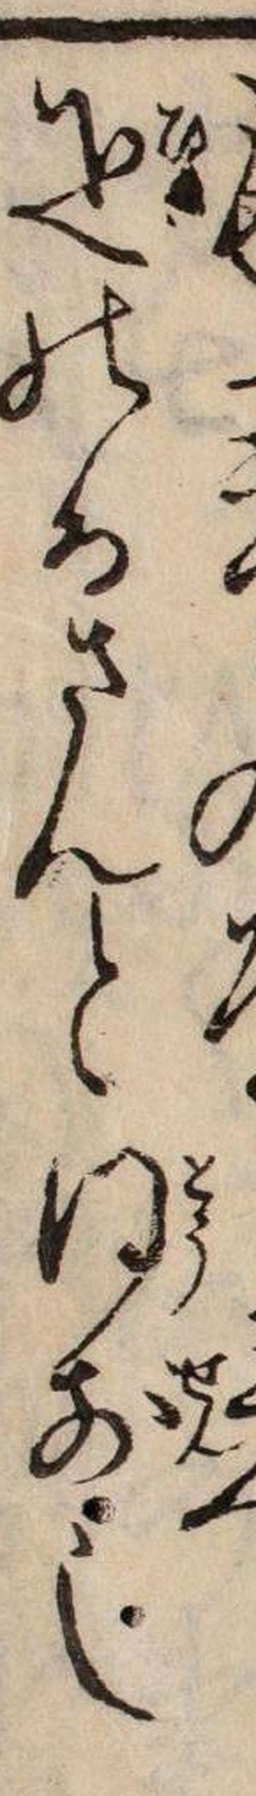疋のるさんと同前也

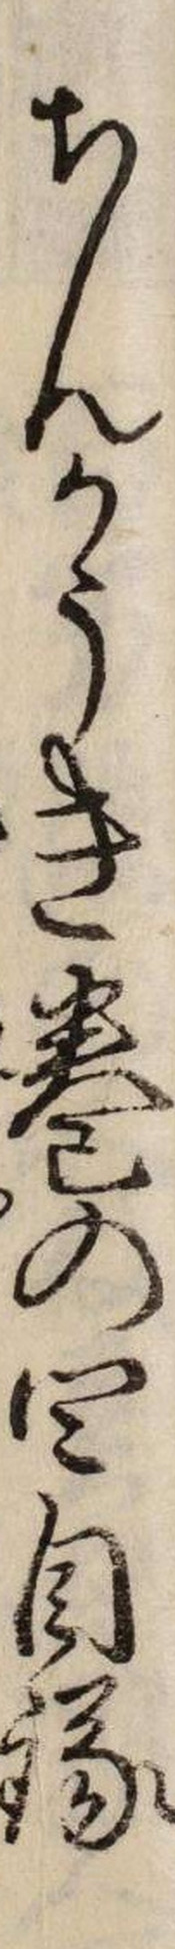ちんかうき巻の四目録
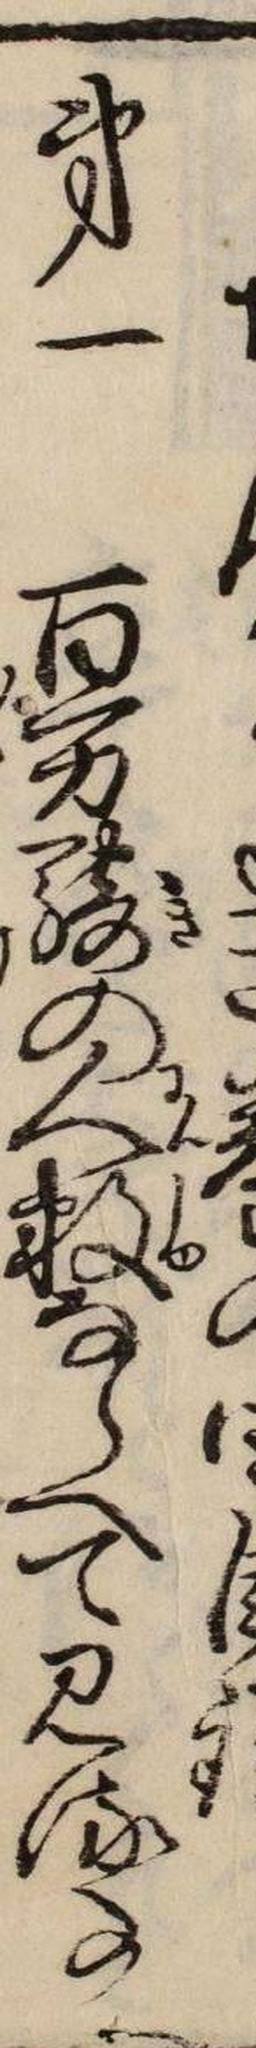第一百万騎の人数ならへて見る事
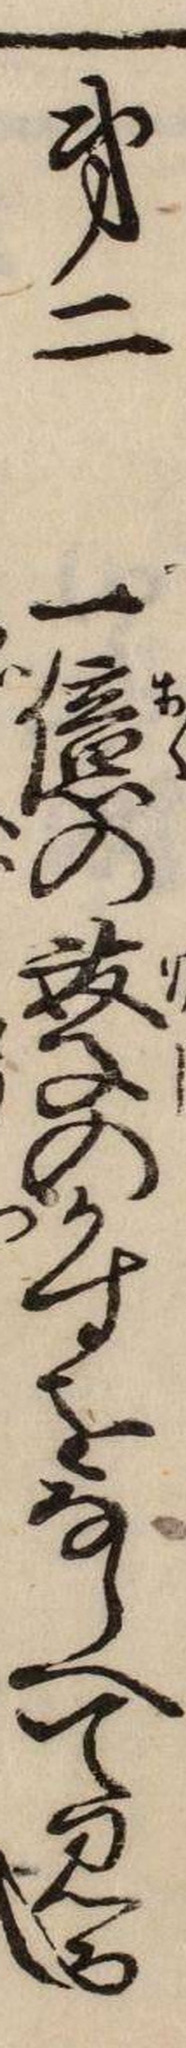第二一億の芥子のかすをならへて見る事
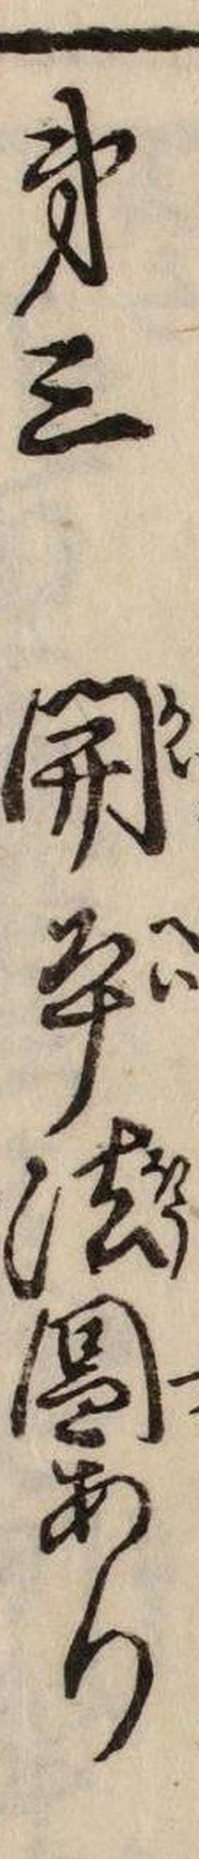第三開平法図あり
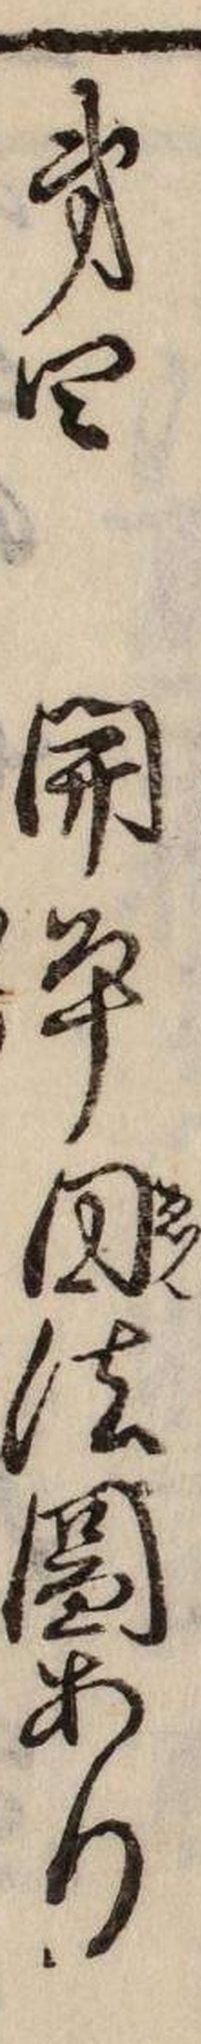第四開平円法図あり
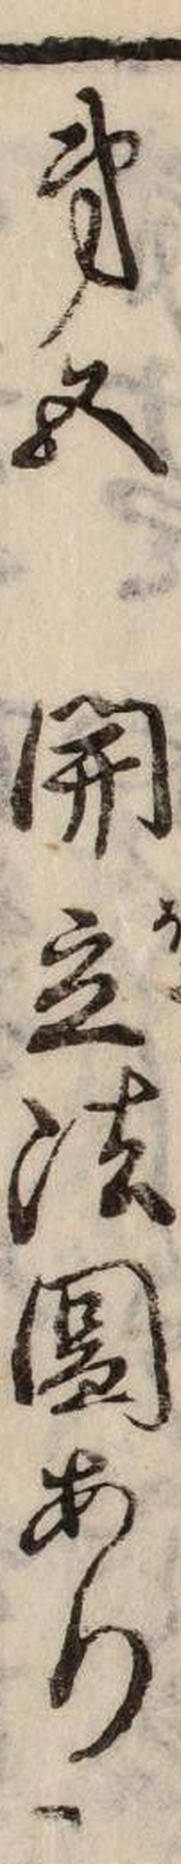第五開立法図あり
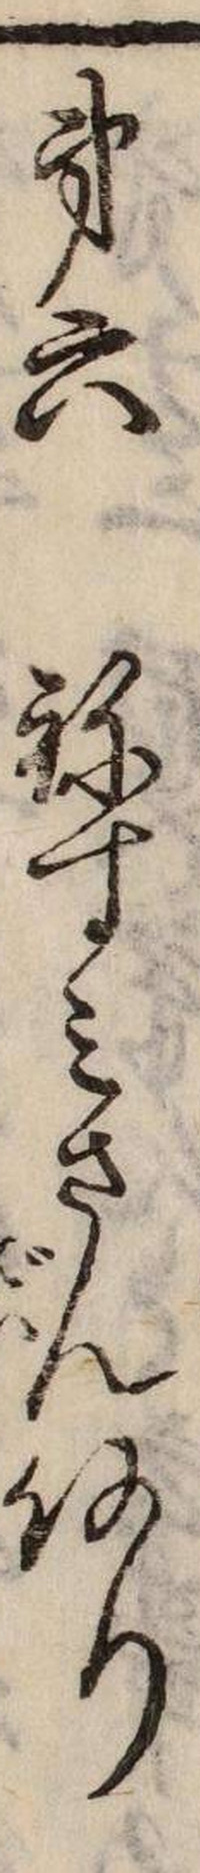第六ねすみさんあり
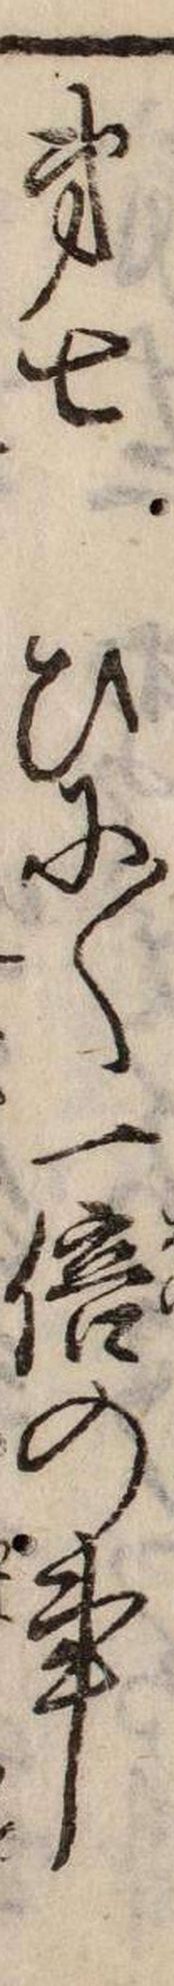第七ひにひに一倍の事
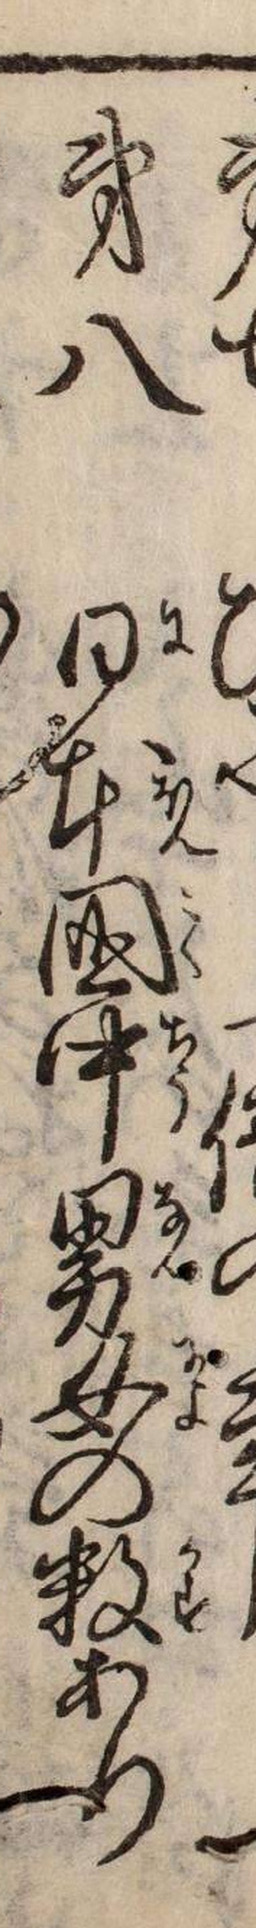第八日本国中男女の数あり
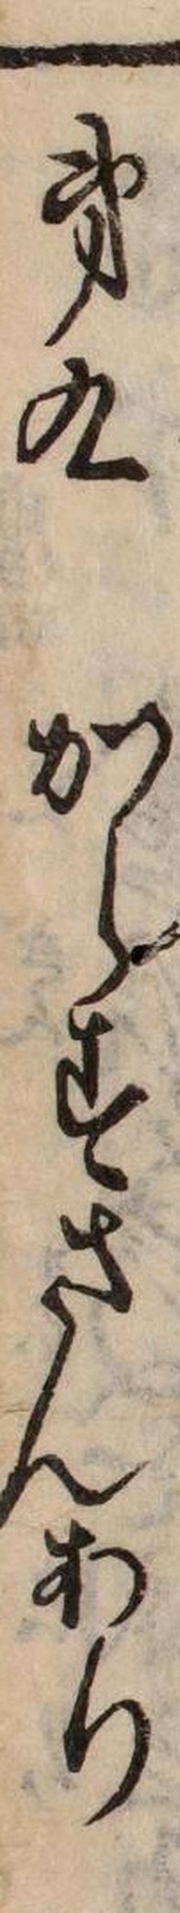第九からすさんあり

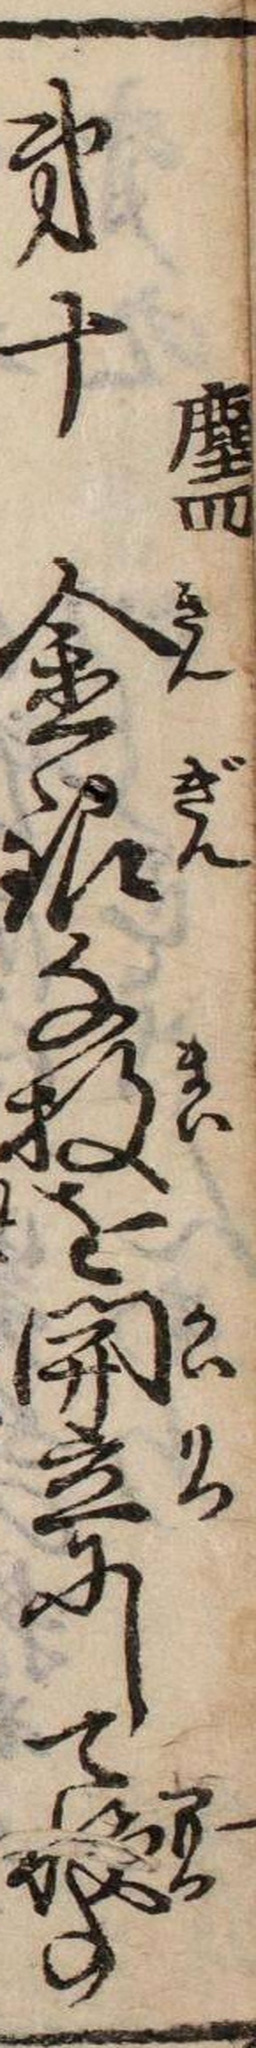第十金銀千枚を開立にして積事
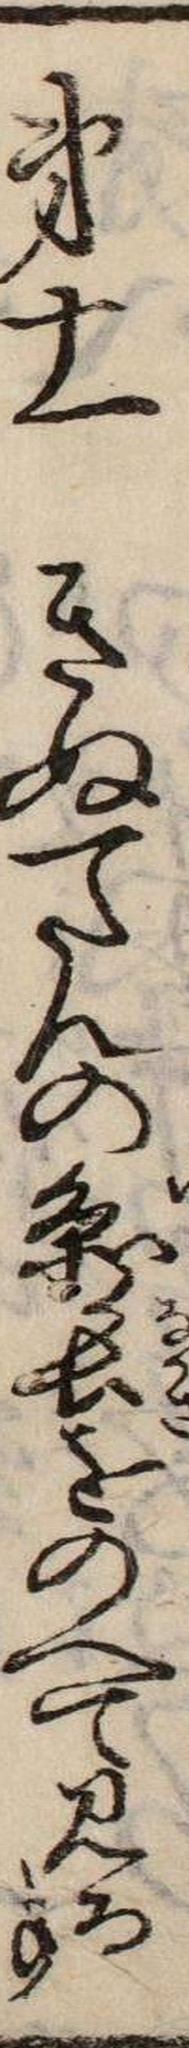第十一きぬ一たんの糸長をのへて見る事
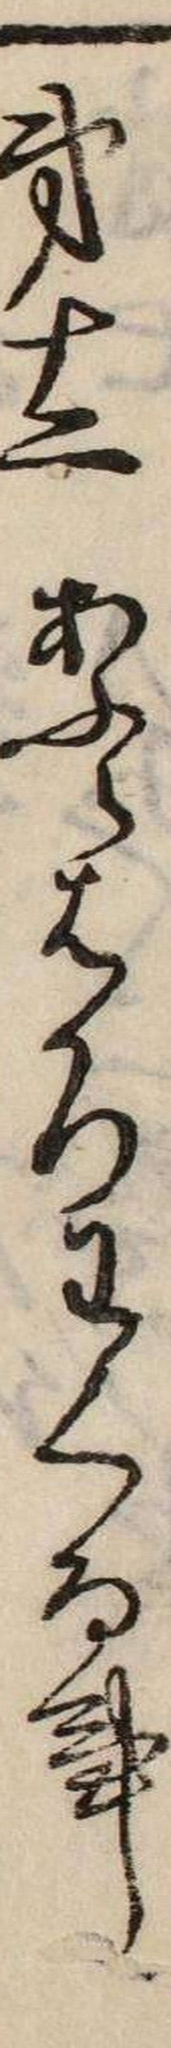第十二あふらはかりわける事
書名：塵劫記（寛永11年自跋、京都府立京都学・歴彩館追貴8）
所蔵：京都府立京都学・歴彩館 国文学研究資料館
